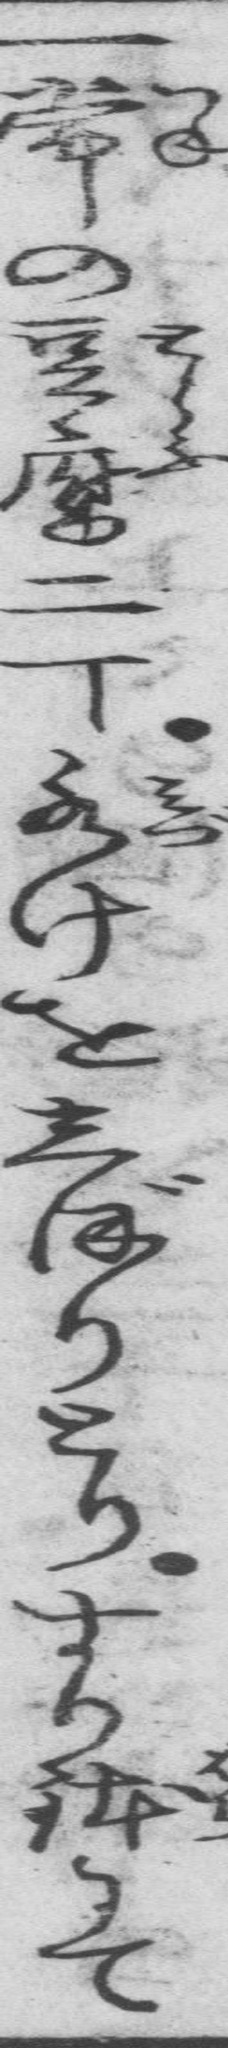一常の豆腐二丁。水けをしぼりとり。すり鉢にて

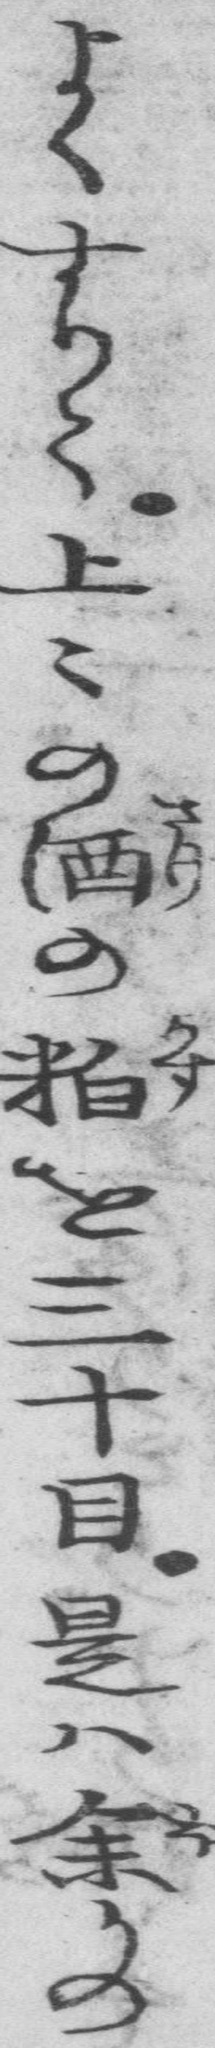よくすりて。上々の酒の粕を三十目。是は余かの
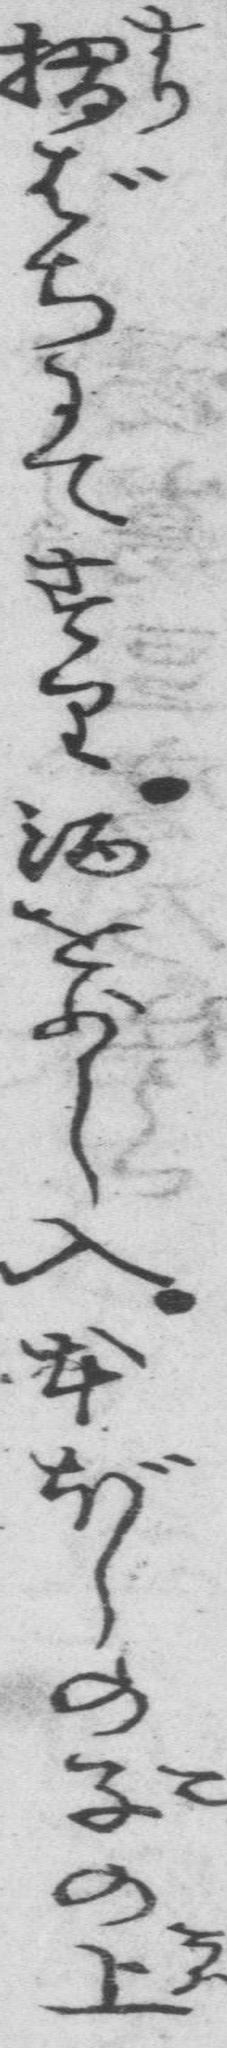摺ばちにてすり。酒を少し入。本ぼしの子の上
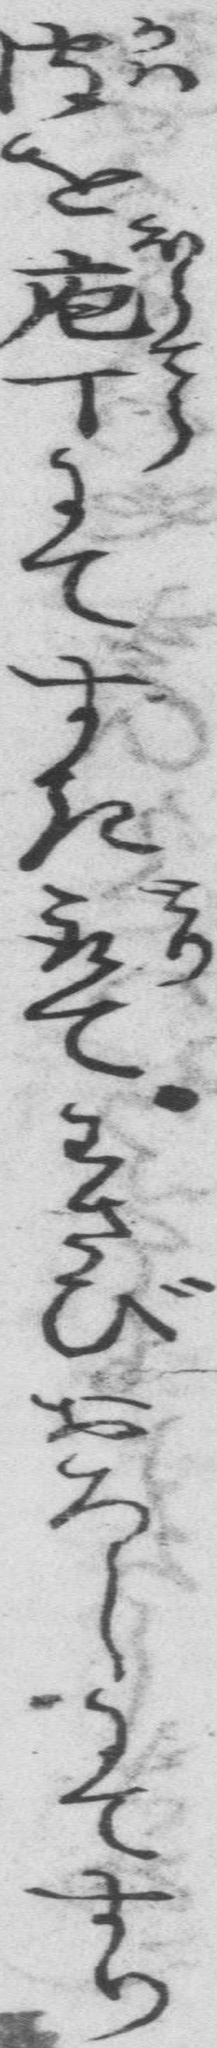皮を包丁にてすき取て。わさびおろしにてすり
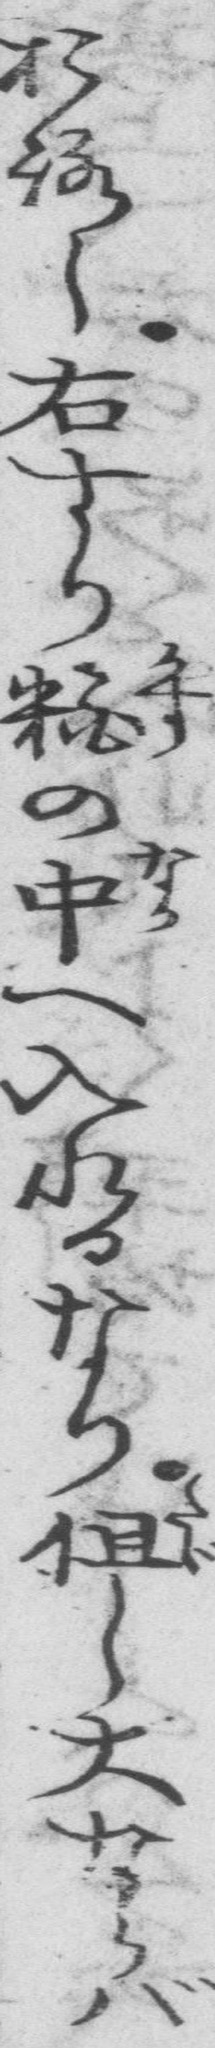おろし。右すり粕の中へ入れるなり。但し大ならば
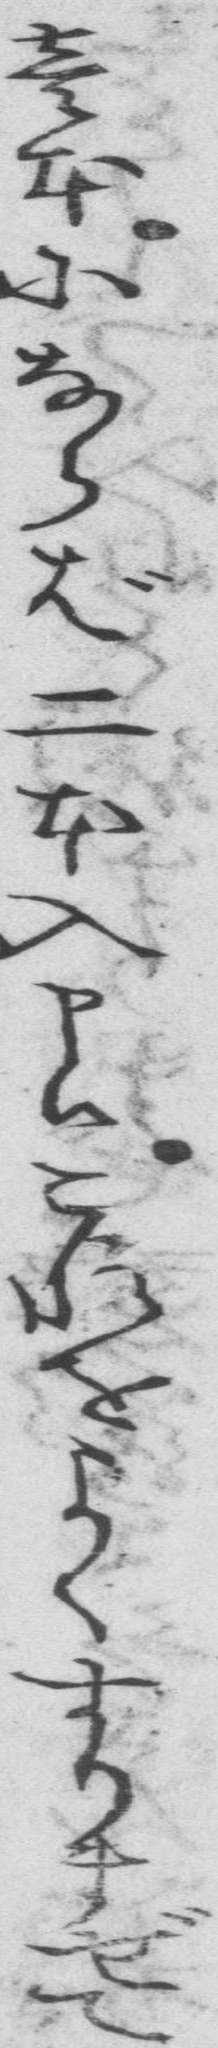壱本。小ならば二本入申候。これをよくすりまぜて
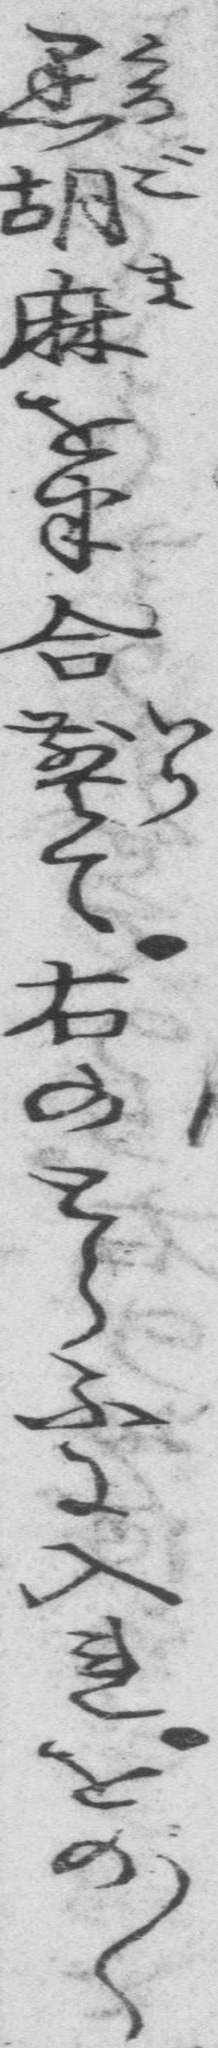黒胡麻を半合煎て。右のとうふに入れ。をの〳〵
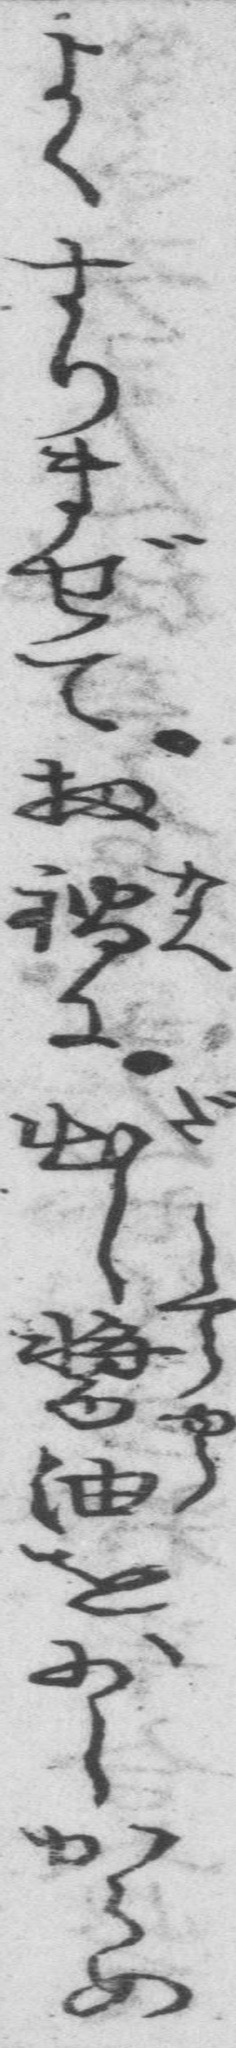よくすりまぜて。扨鍋に。出し醤油を少しからめ
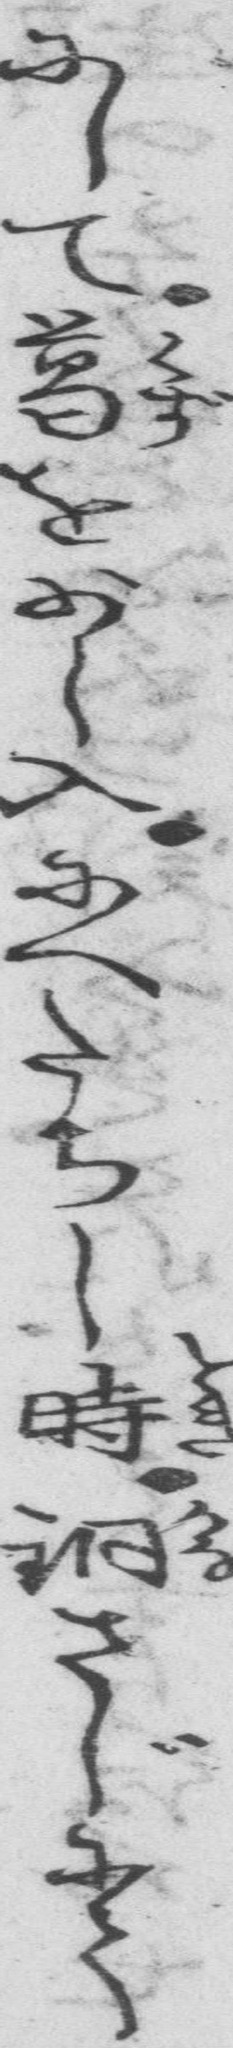にして。葛を少し入。にへたちし時。銅さじにて
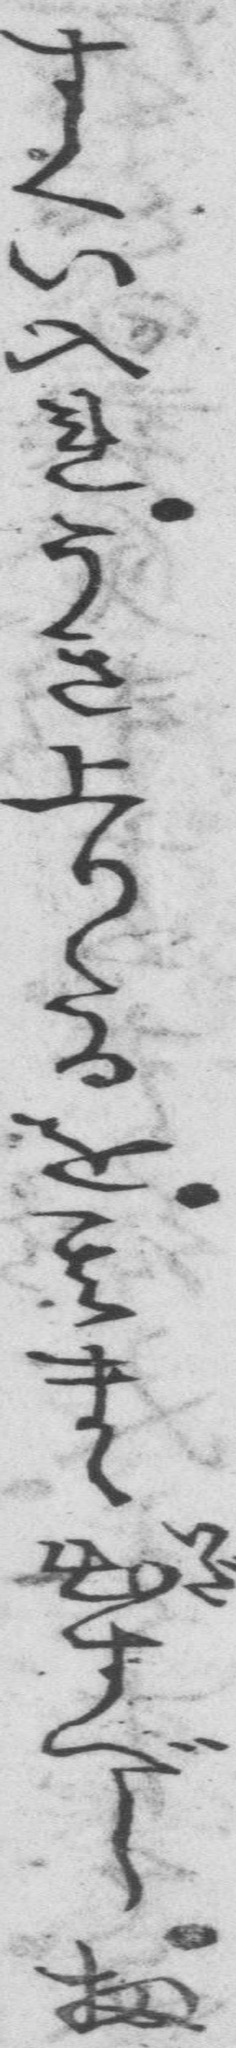すくい入れ。うき上りたるを。其まゝ出すべし。扨
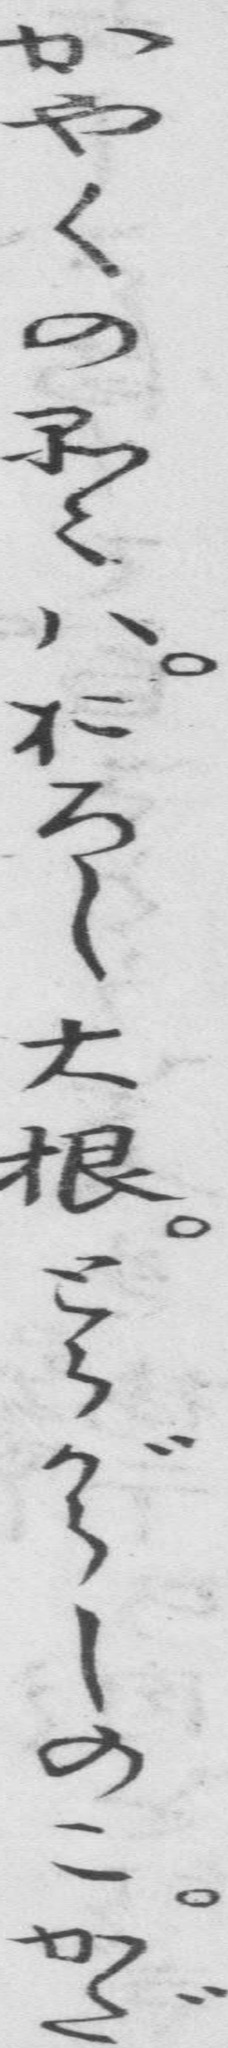かやくの品々は。おろし大根。とうがらしのこ。かだ
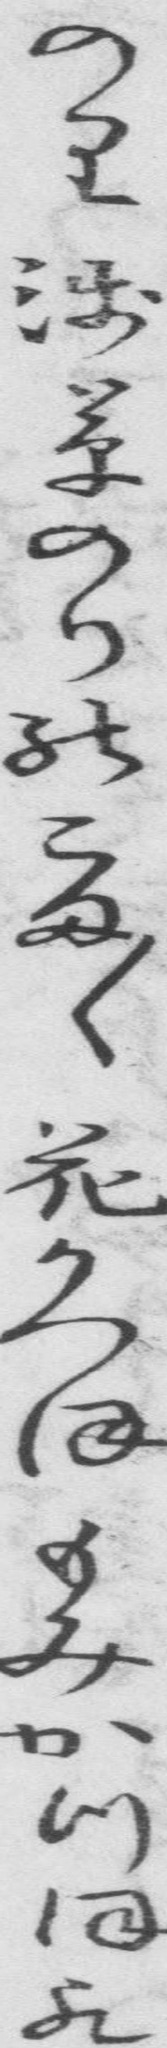のり。浅草のりのこま〳〵。花かつほ、もみかつほ歟
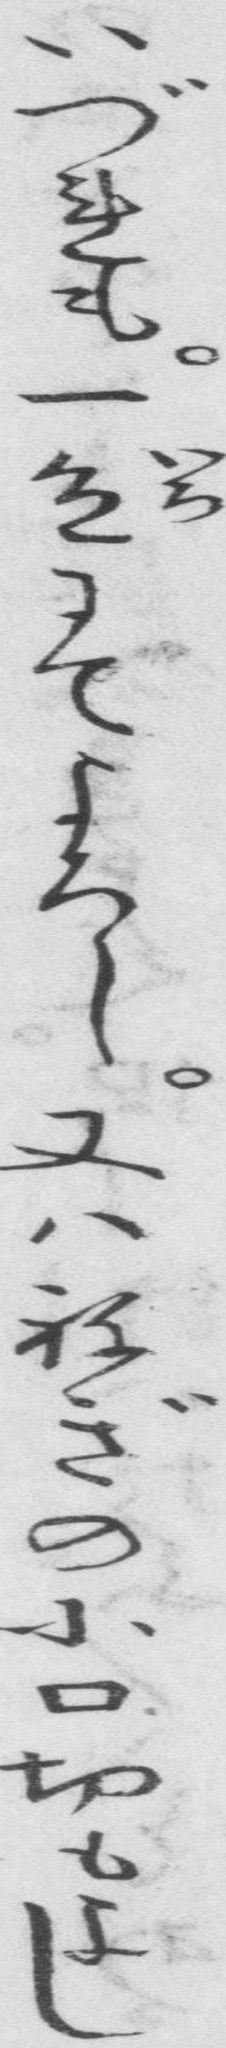いづれも、一色にてよろし。又はねぎの小口切もよし
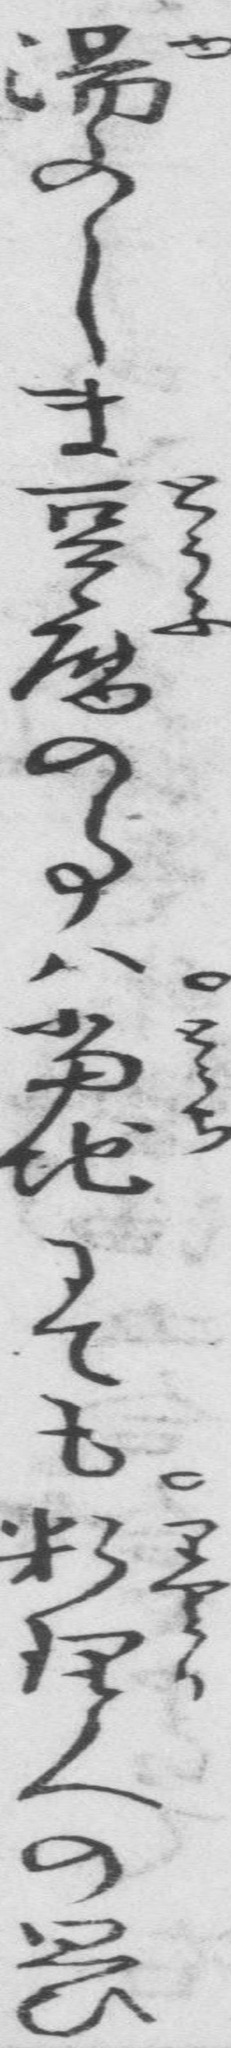湯のしま豆腐の事は、当地にても。料理人の思ひ
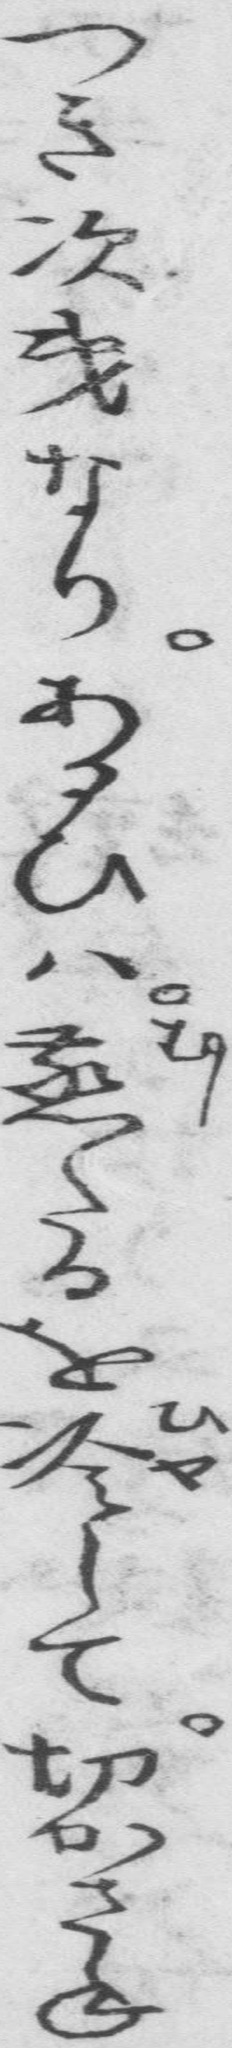つき次第なり。あるひは。蒸たるを冷して。切かさね
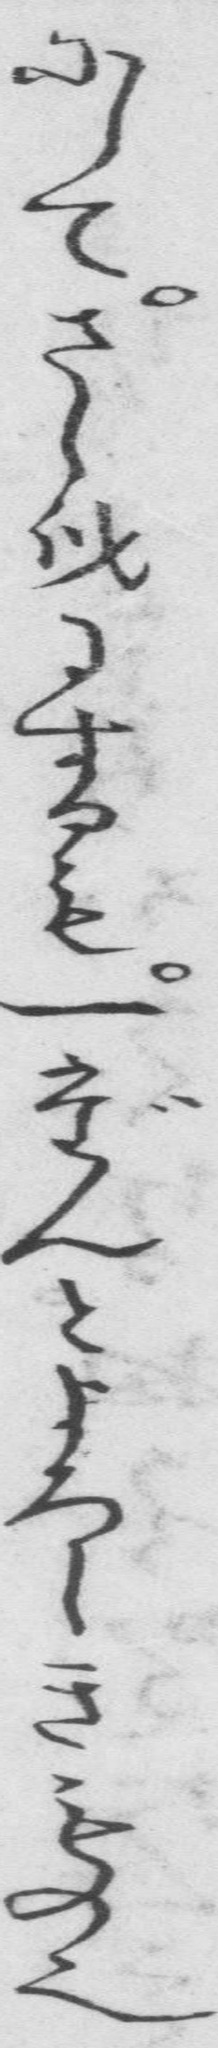にして。さし身にするも。一だんとよろしきもの也
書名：萬寳料理秘密箱
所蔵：大阪府立大学学術情報センター 国文学研究資料館
